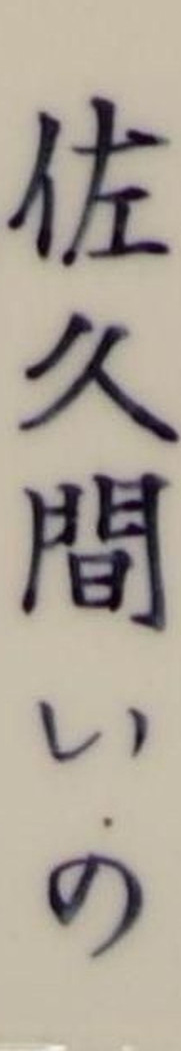佐久間いの
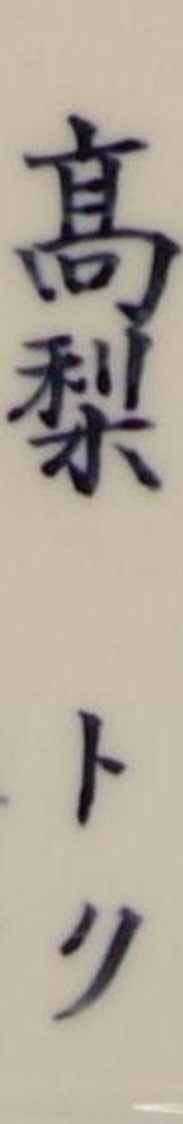高梨トク
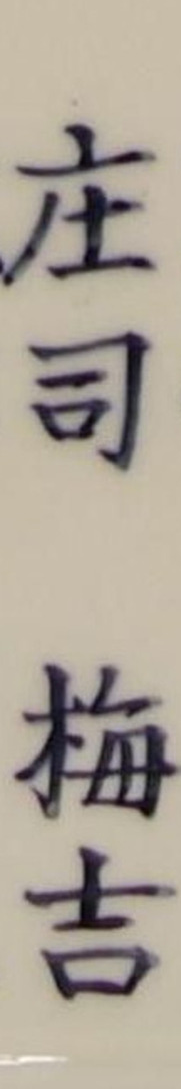庄司梅吉
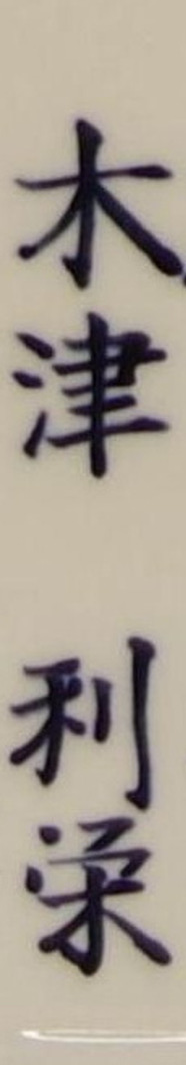木津利栄
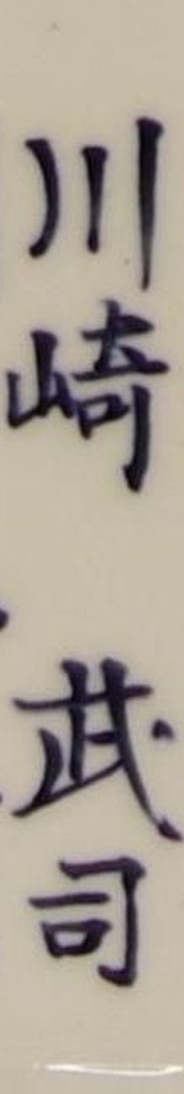川崎武司
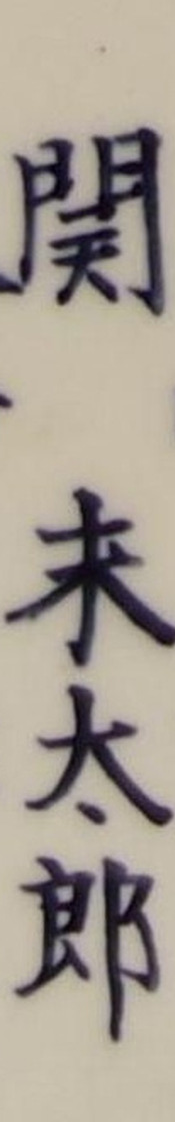関未太郎
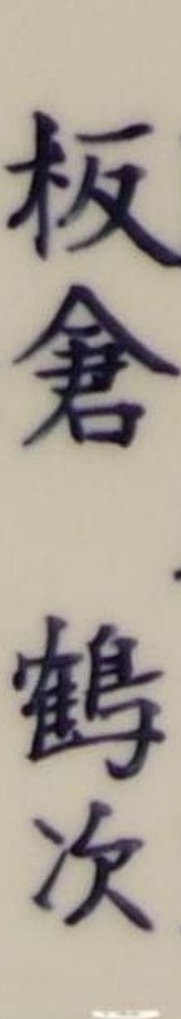板倉鶴次
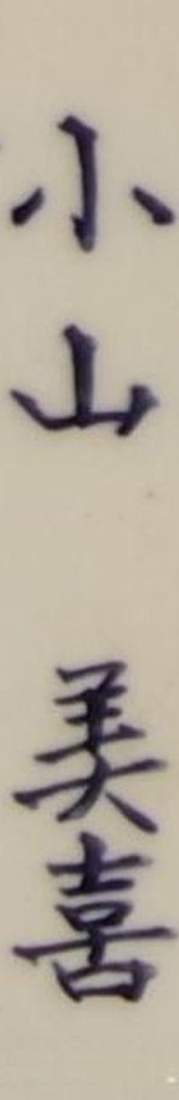小山美喜
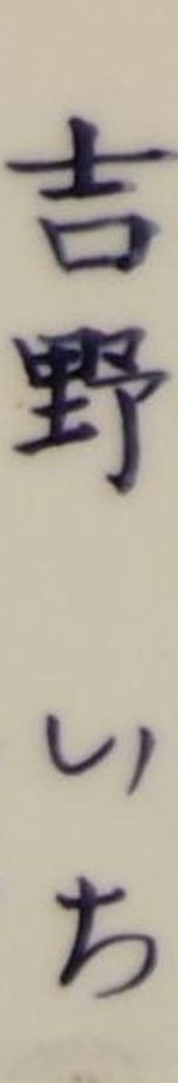吉野いち
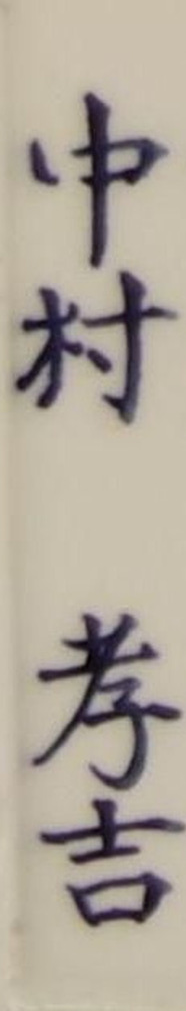中村孝吉

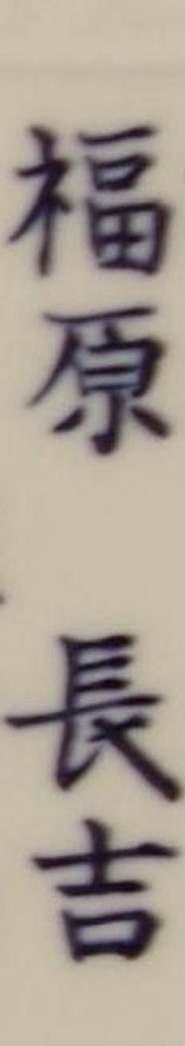福原長吉
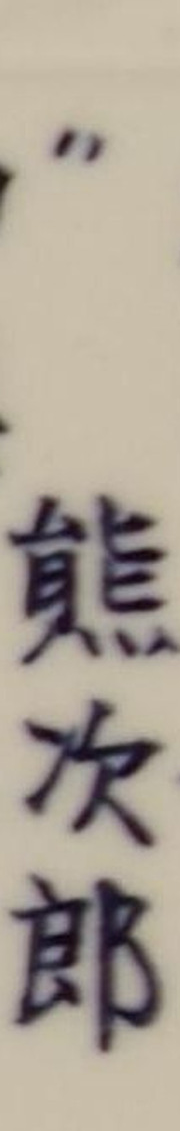熊次郎
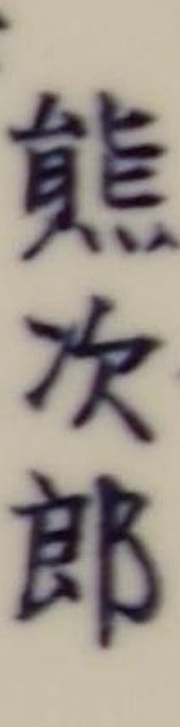熊次郎
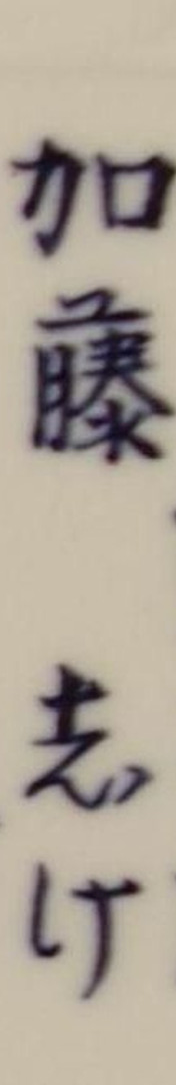加藤しげ
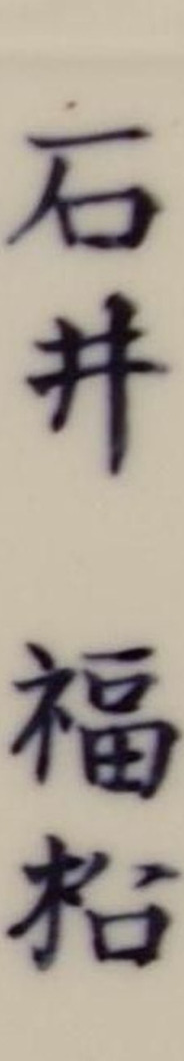石井福松
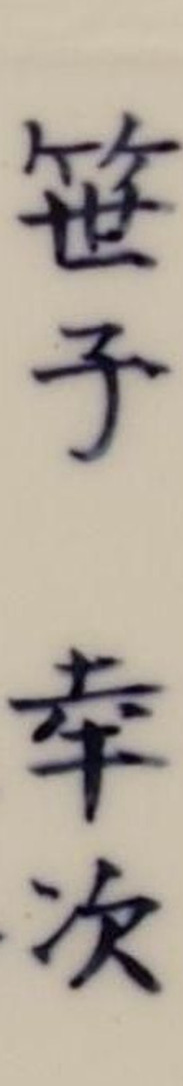笹子幸次
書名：E~L
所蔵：高野山金剛峯寺
